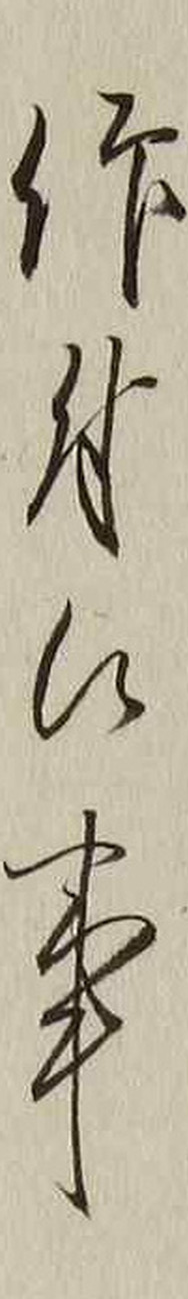仰付候事
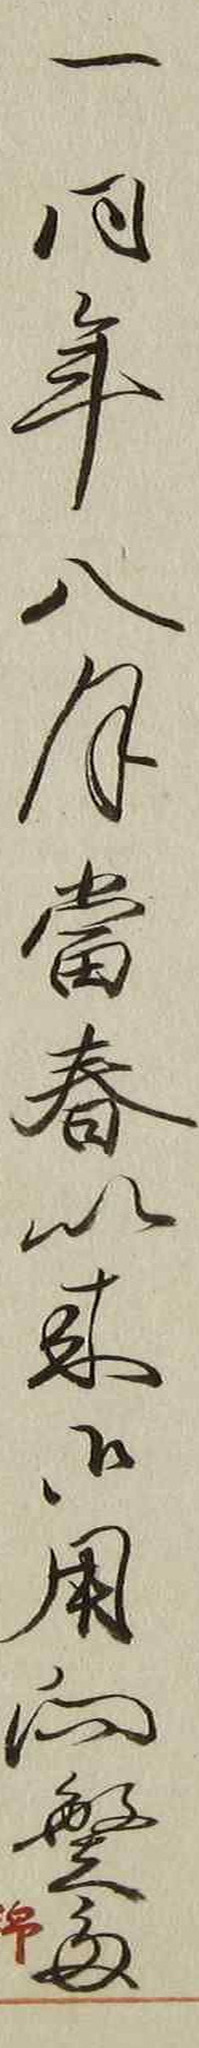一同年八月当春以来御用向繁多
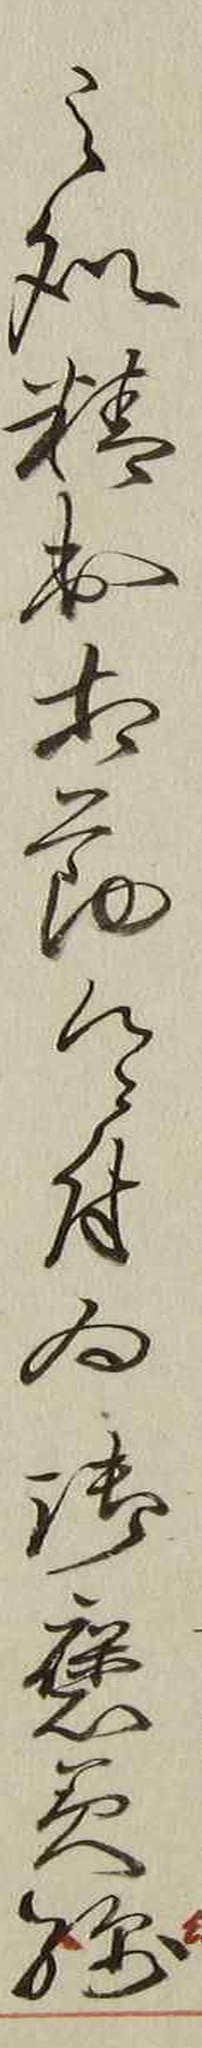之処精出相勤候二付為御褒美
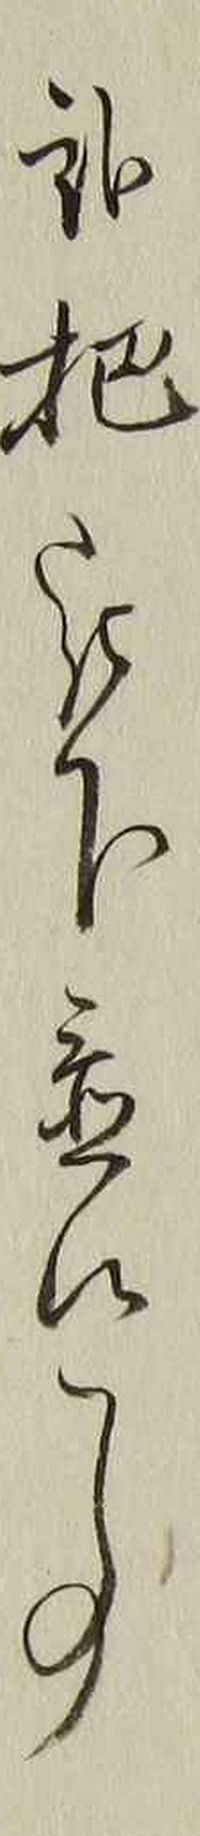弐把被下置候事
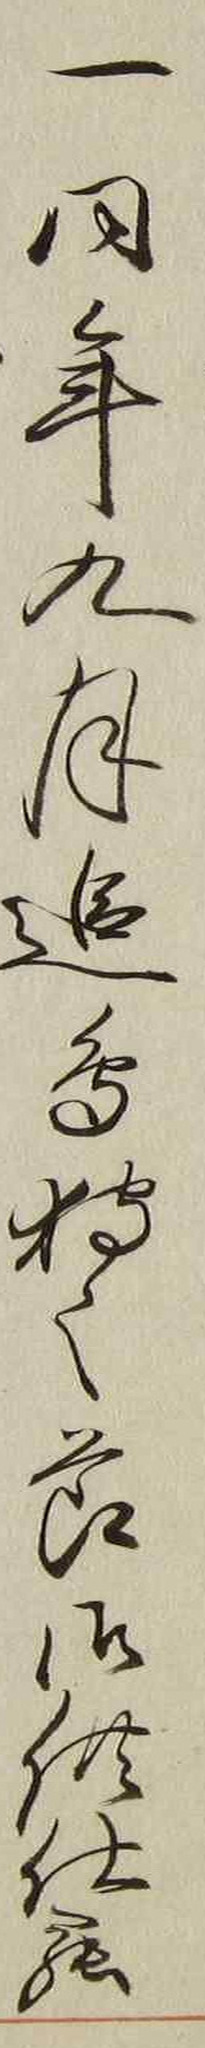一同年九月追鳥狩之節御供仕罷
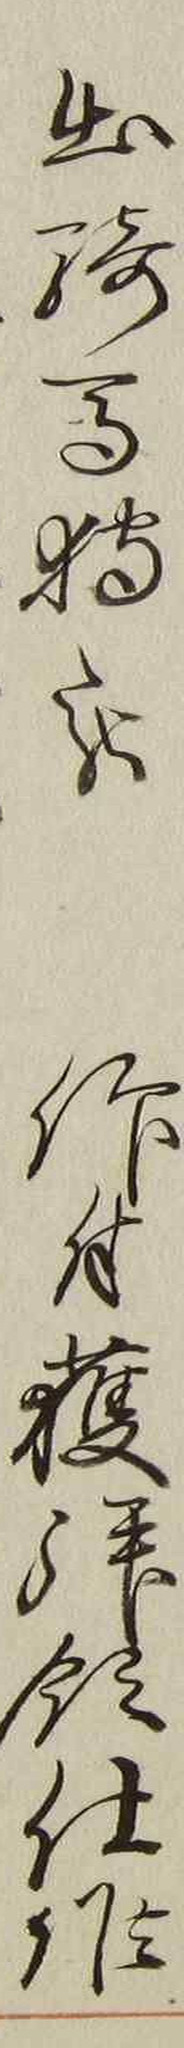出騎馬狩被仰付獲拝領仕候
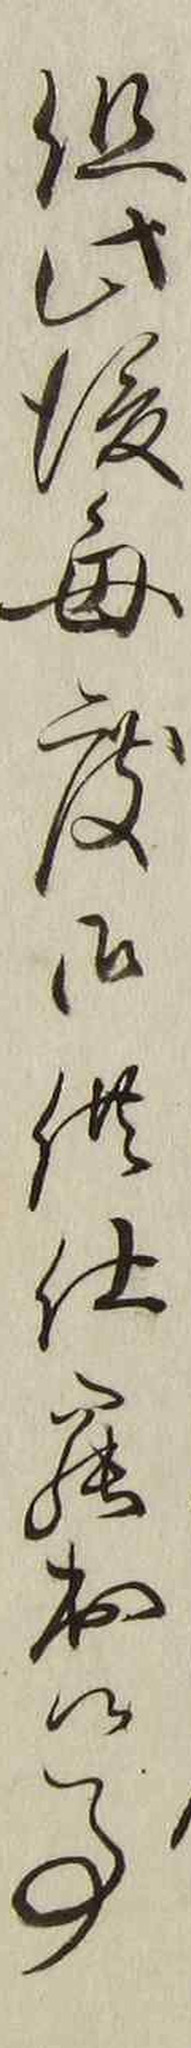但此後毎度御供仕罷出候事
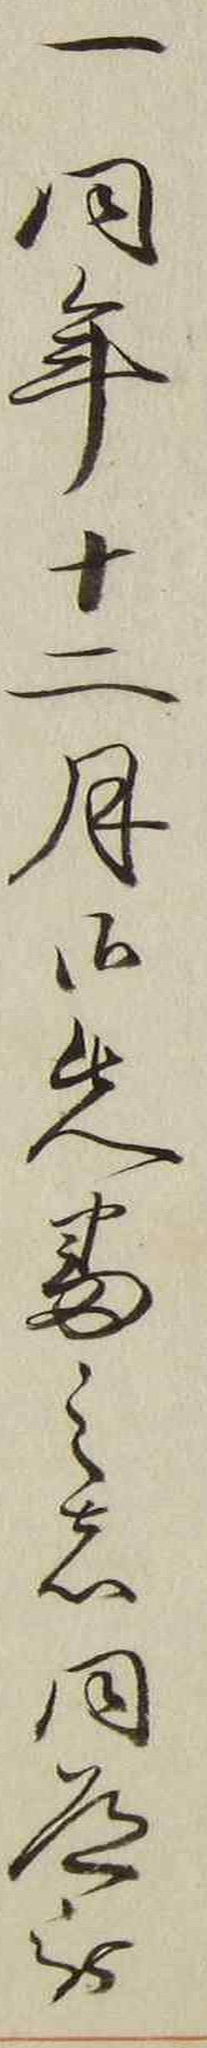一同年十二月御先番之者同道被

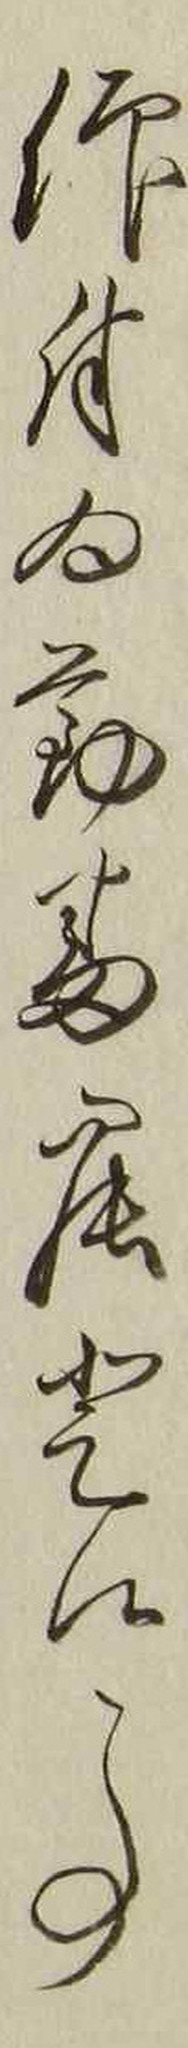仰付為勤番罷登候事
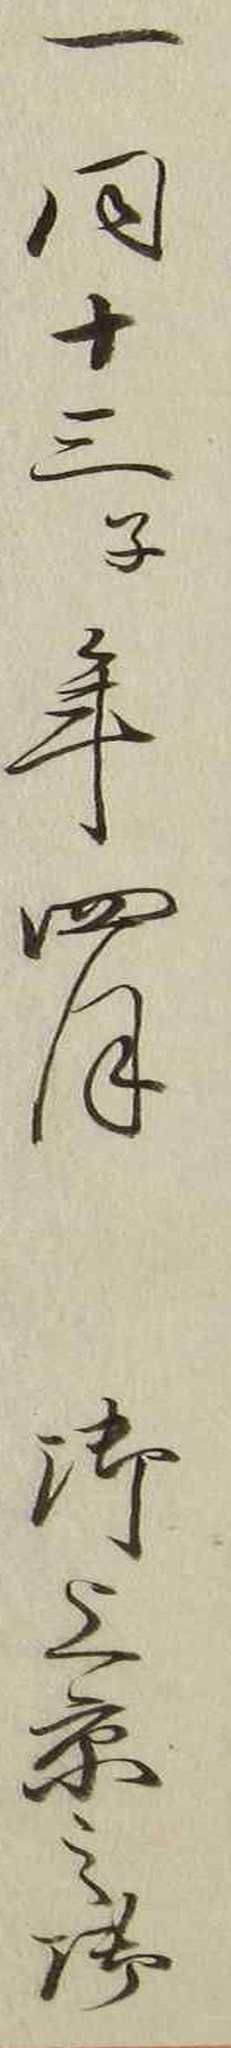一同十三子年四月御上京之御
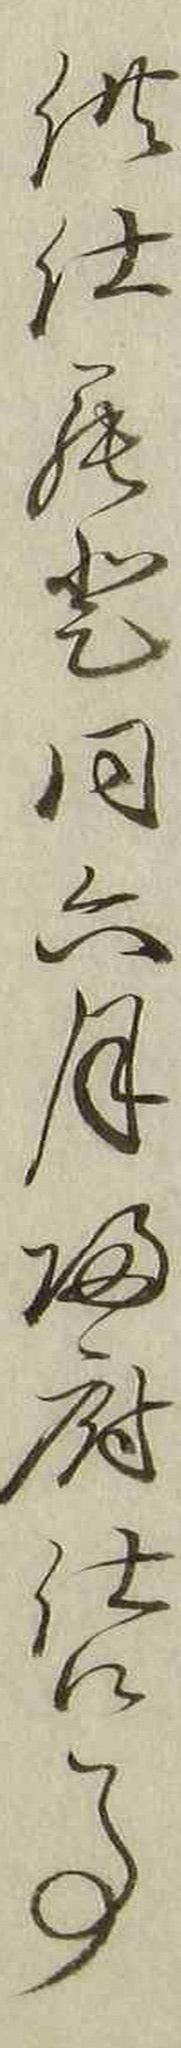供仕罷登同六月帰府仕候事
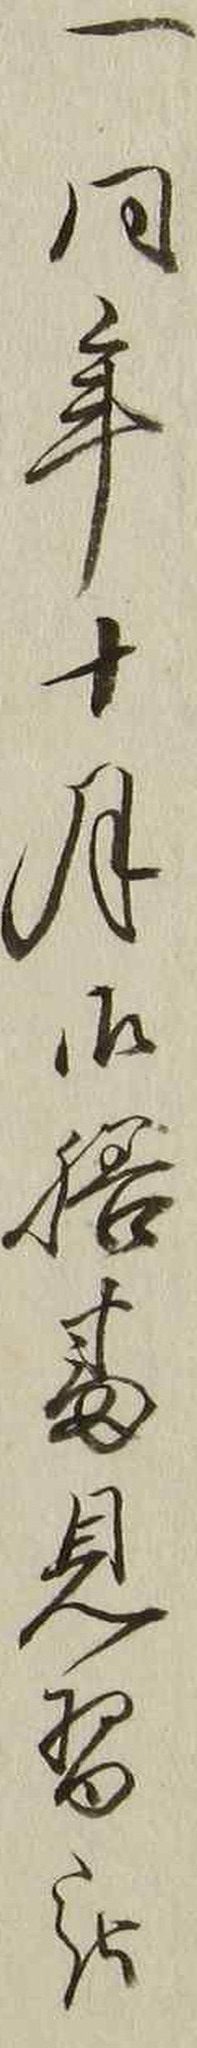一同年十月御膳番見習被
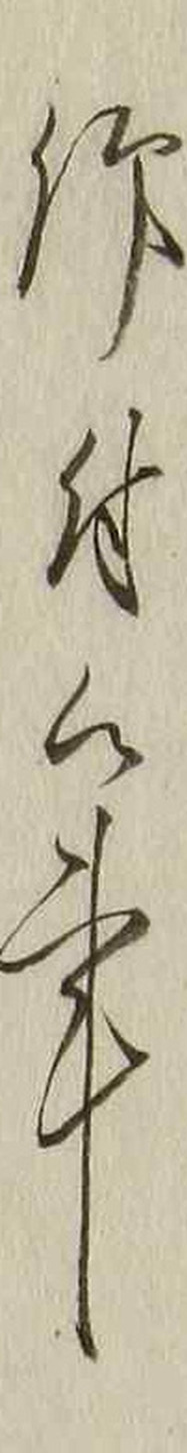仰付候事
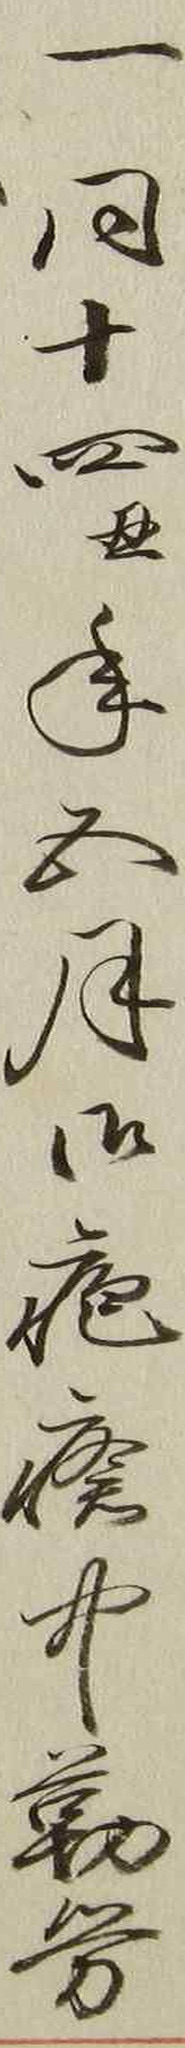一同十四丑年五月御疱瘡中勤労
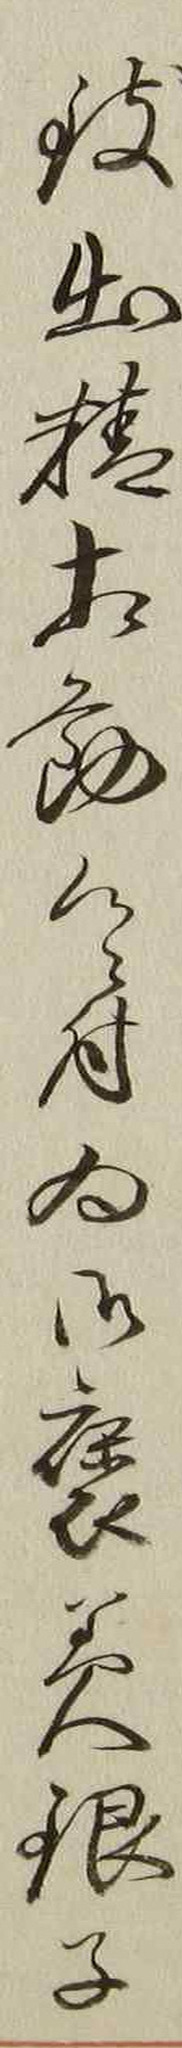致出精相勤候二付為御褒美銀子
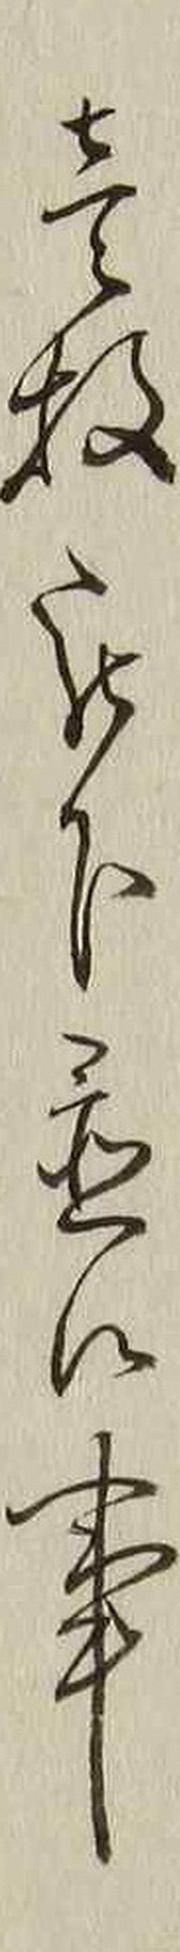壱枚被下置候事
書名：諸士系譜　巻之54　ほ之部1
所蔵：会津若松市立会津図書館
